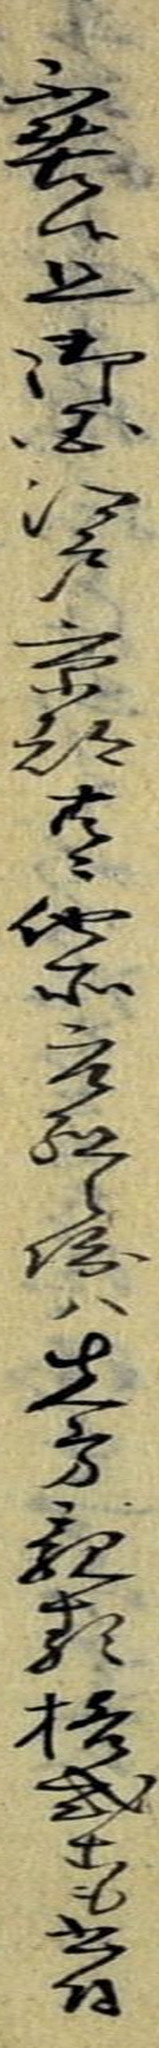不苦候且御国江戸京都共ニ他所取組之儀ハ先方親類格式等も書付
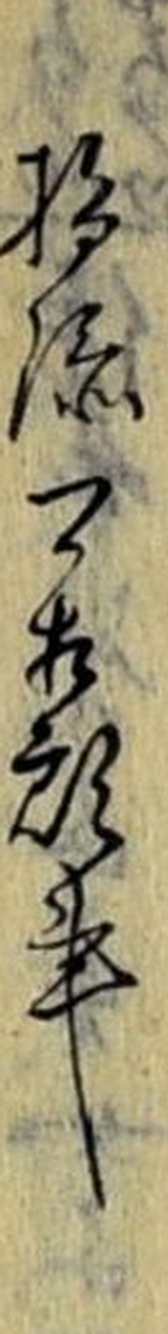指添可相願事
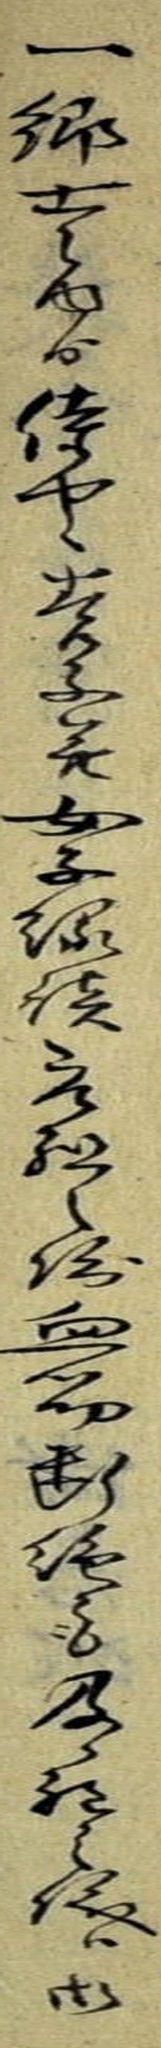一郷士之内ゟ侍中へ養子幷女子縁談取組之儀血筋断絶ニも及候程之儀ハ御
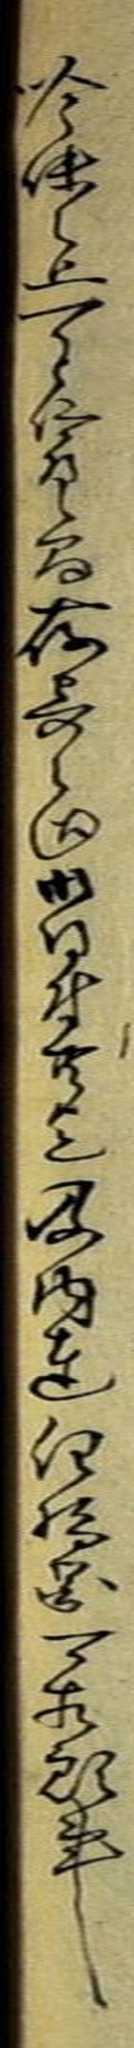吟味之上可被仰付候間存寄之趣御目付共迄及内達任指図可相願事
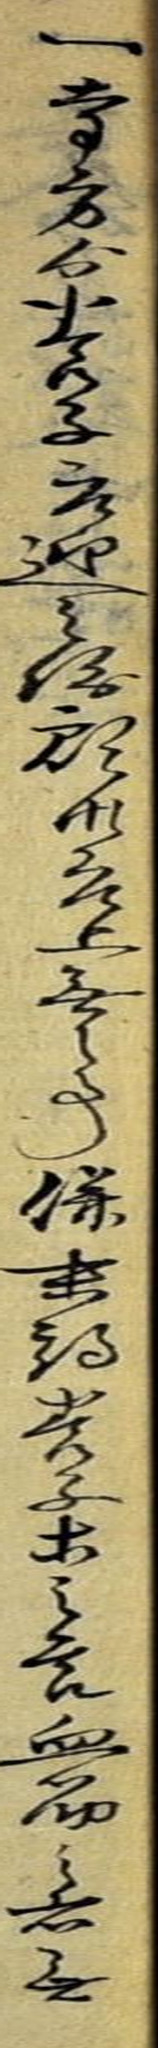一寺方ゟ養子取迎之儀願御取上無之事併末期養子等之節血筋之者無
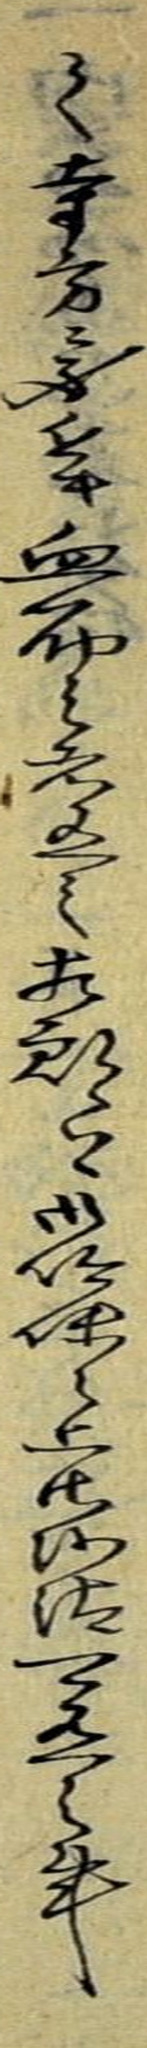之寺方ニ身近キ血筋之者有之相願候ハヽ御吟味之上御沙汰可有之事
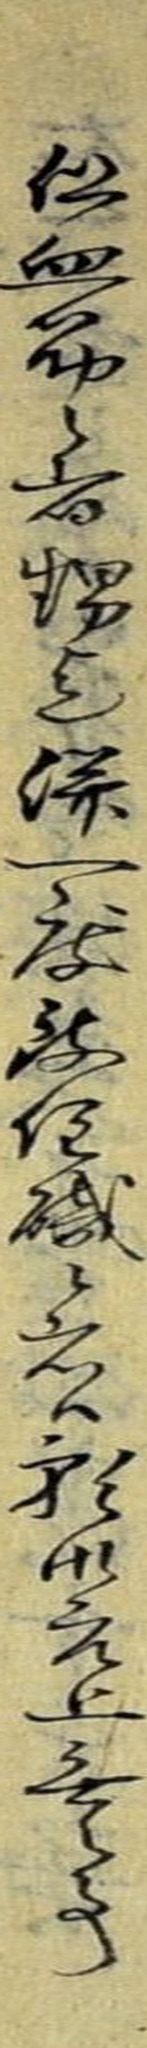但血筋之者甥迄併一度致住職候者ハ願御取上無之事
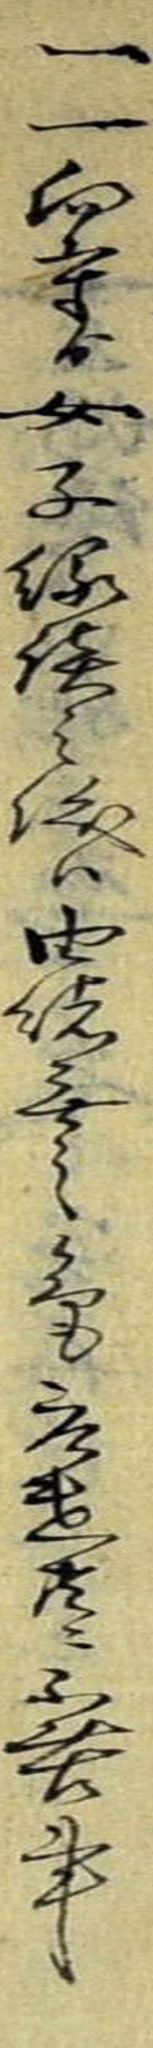一一向寺ゟ女子縁談之儀ハ由緒無之候而も取遣共ニ不苦事
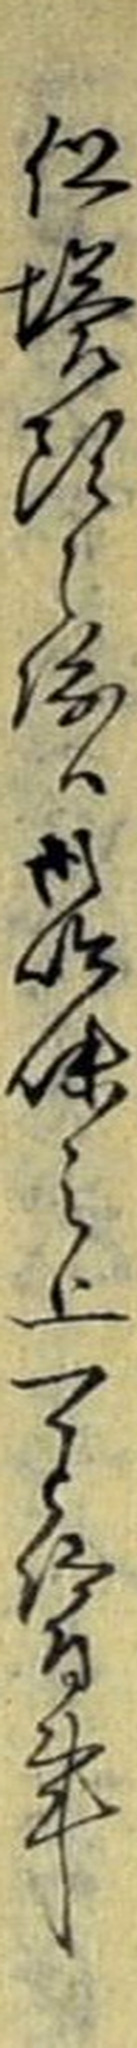但塔頭之儀ハ御吟味之上可被仰付事
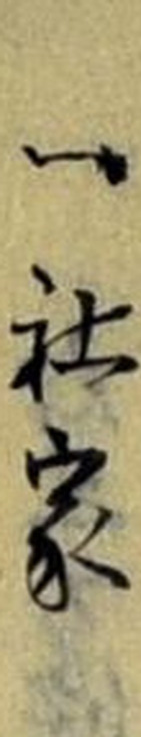一社家
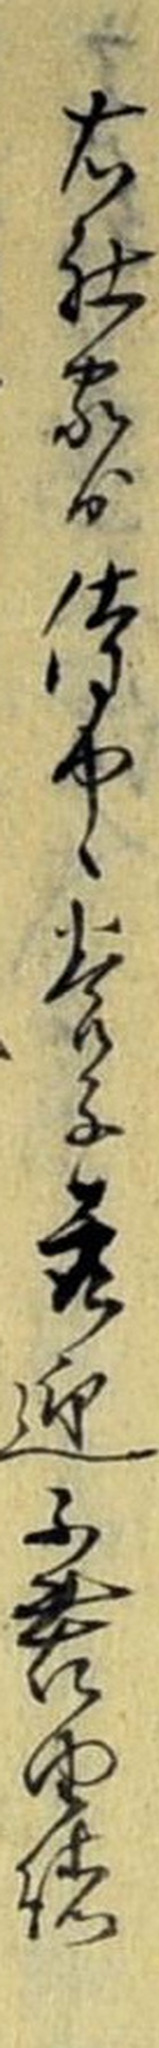右社家ゟ侍中へ養子取迎不苦由緒
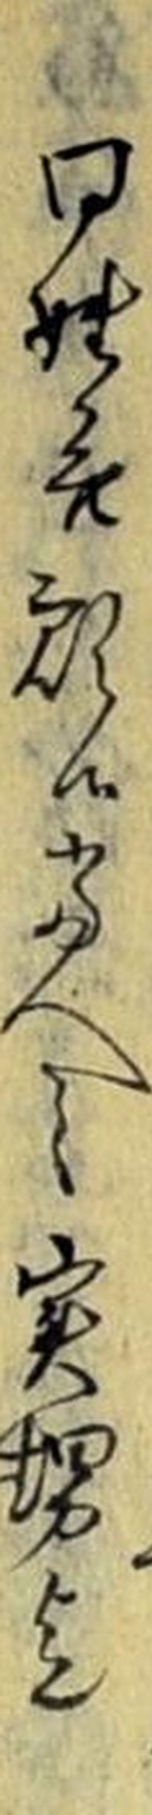同姓并願候当人之実甥迄
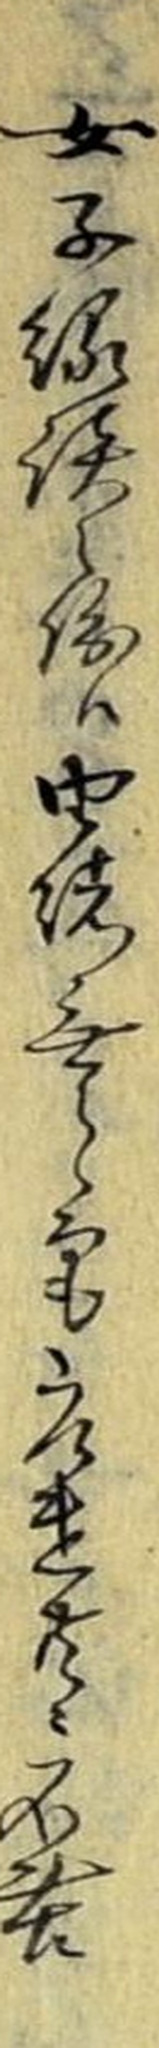女子縁談之儀ハ由緒無之候而も取遣共ニ不苦
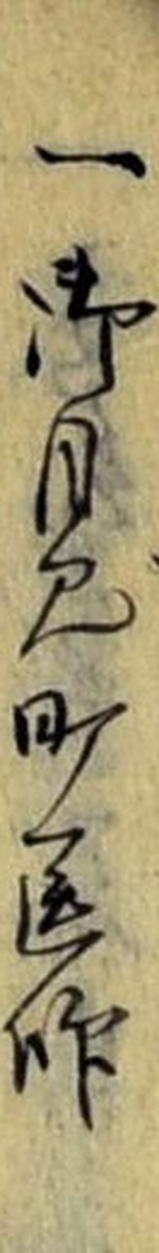一御目見町医師
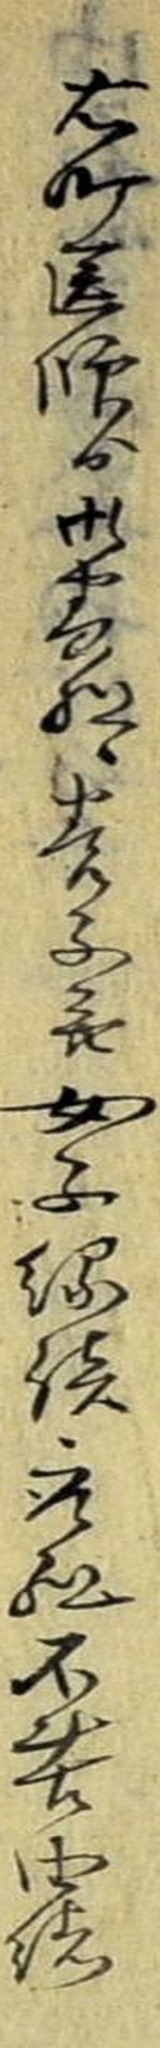右町医師ゟ御番組へ養子并女子縁談取組不苦由緒
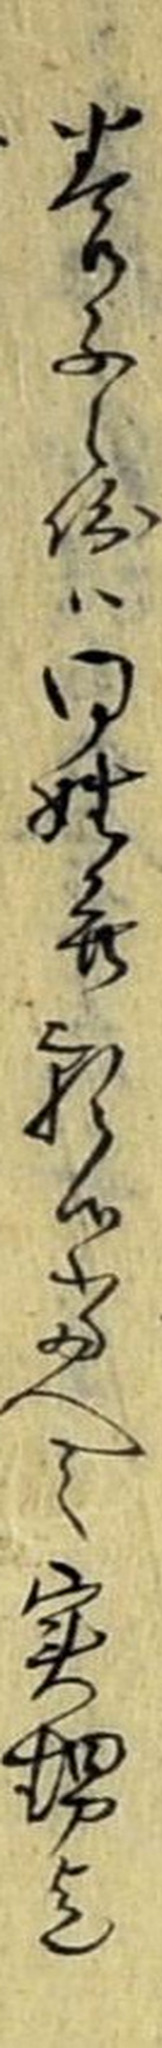養子之儀ハ同姓并願候当人之実甥迄
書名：命令之部 三
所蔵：福井県文書館 Fukui Prefectural Archives
